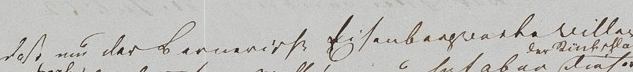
daß um der Bernerischen Eisenbergwerke Willen
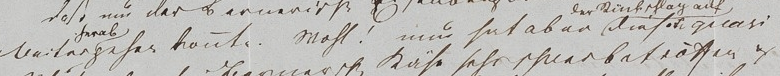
weiter herabgehen konnte. Wohl! nun hat aber der Rückschlag auf diesen
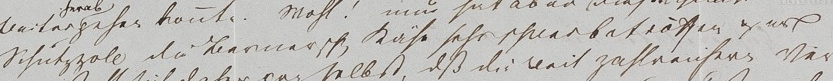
Schutzzoll die Bernerschen Käse sehr schwer betroffen & es
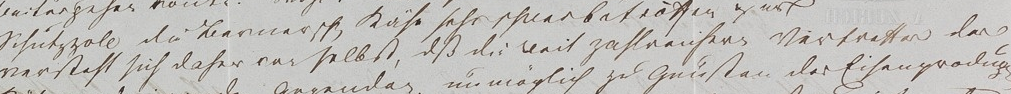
versteht sich daher von selbst, dß die weit zahlreichern Vertretter der
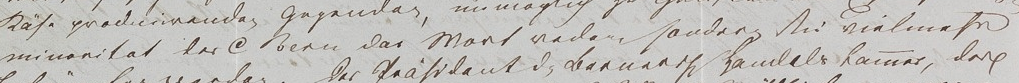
minorität des C Bern das Wort reden, sondern sie vielmehr
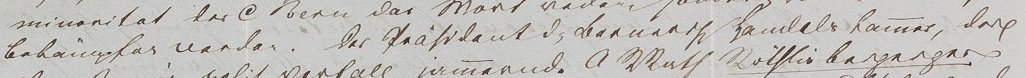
bekämpfen werden. Der Präsident der Bernerschen Handelskammer, der
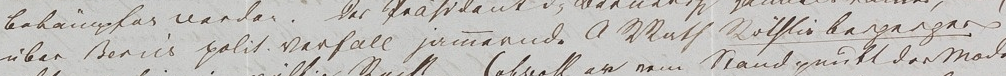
über Bern's polit. Verfall jammernde A RRath Röthlisberperger
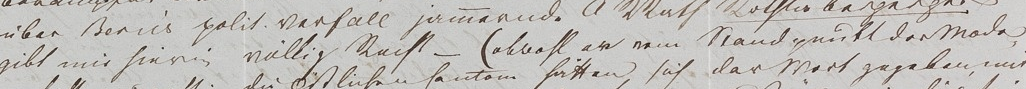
gibt mir hierin völlig Recht – (obwohl er vom Standpunkt der Mode-
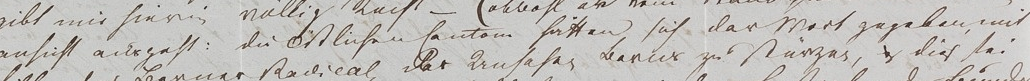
ansicht ausgeht: die östlichen Cantone hätten sich das Wort gegeben, mit
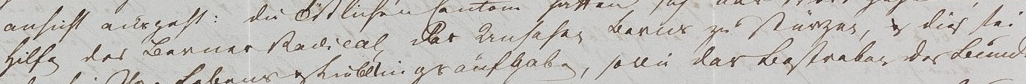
Hilfe der Berner Radicalen das Ansehen Berns zu stürzen, & dies sei
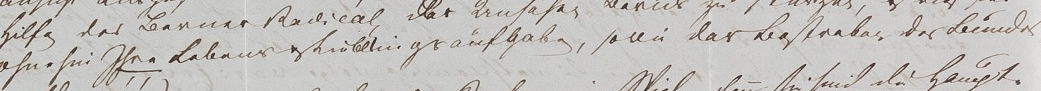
ohnehin Ihre Lebens- & Lieblingsaufgabe, sowie das Bestreben des Bundes-
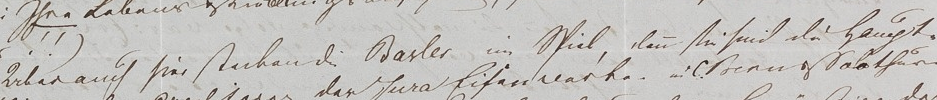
Aber auch hier stecken die Basler im Spiel, denn sie sind die Haupt-
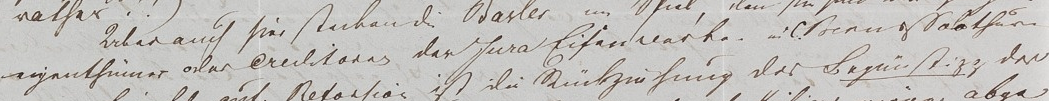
eigenthümer oder Creditoren der Jura Eisenwerke in Bern & Solothurn.
